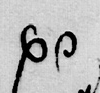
daß
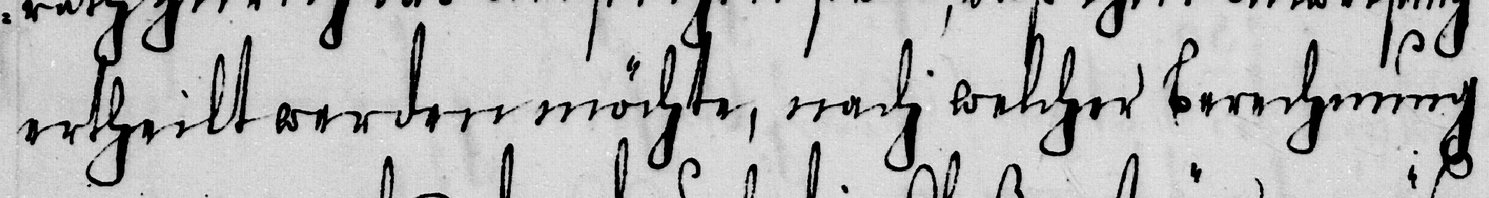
ertheilt werden möchte, nach welcher Berechnung
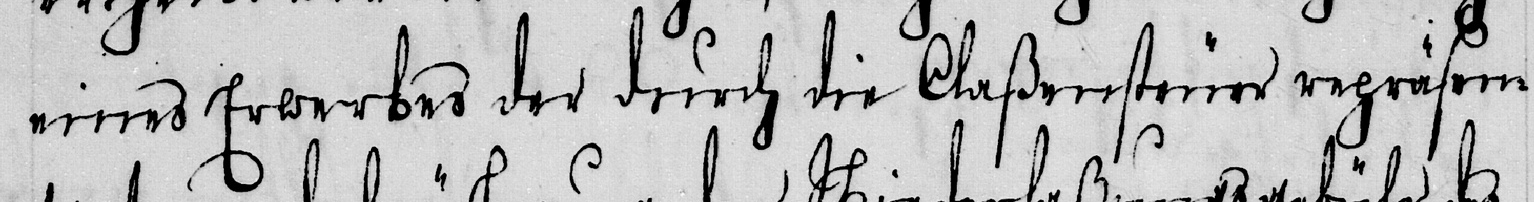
eines Erwerbes der durch die Claßensteuer repräsen¬
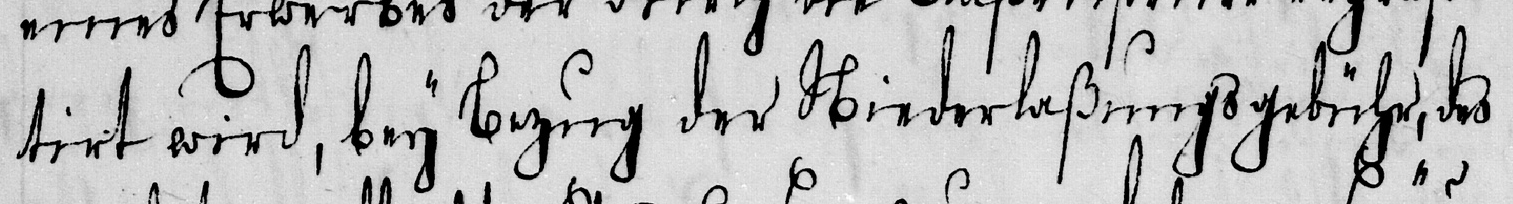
tirt wird, bey Bezug der Niederlaßungsgebühr, des
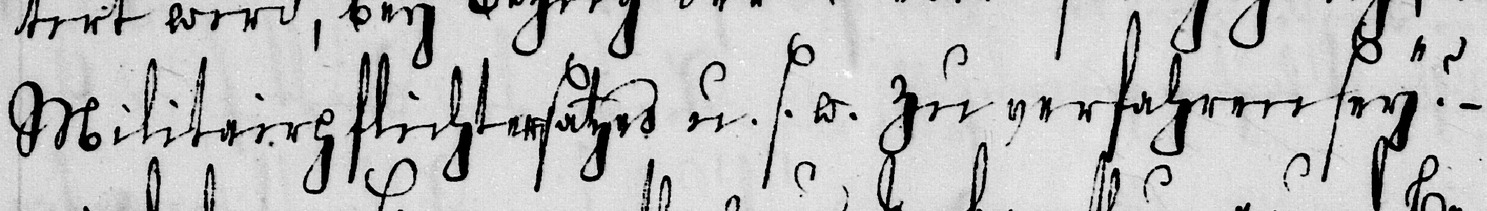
Militairpflichtersatzes u.s.w. zu verfahren sey?
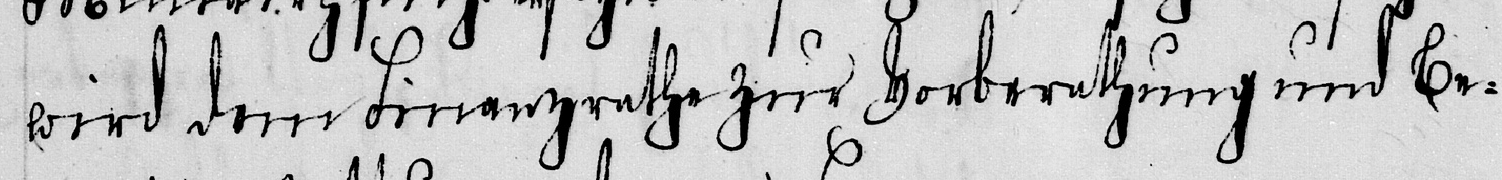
wird dem Finanzrathe zur Vorberathung und Be¬
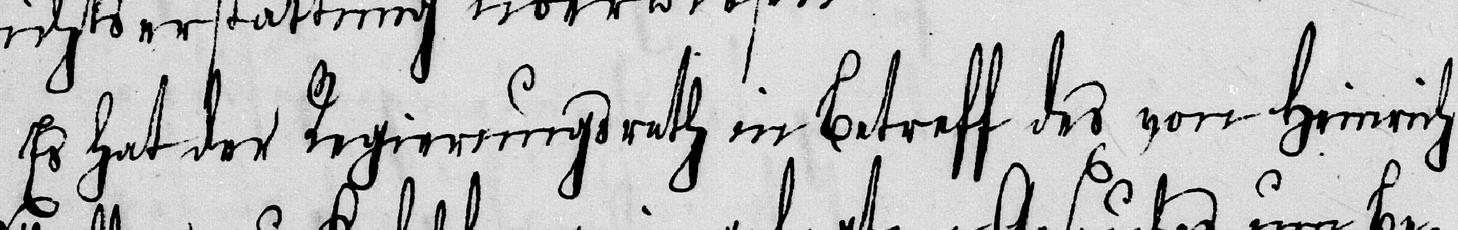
Es hat der Regierungsrath in Betreff des von Heinrich
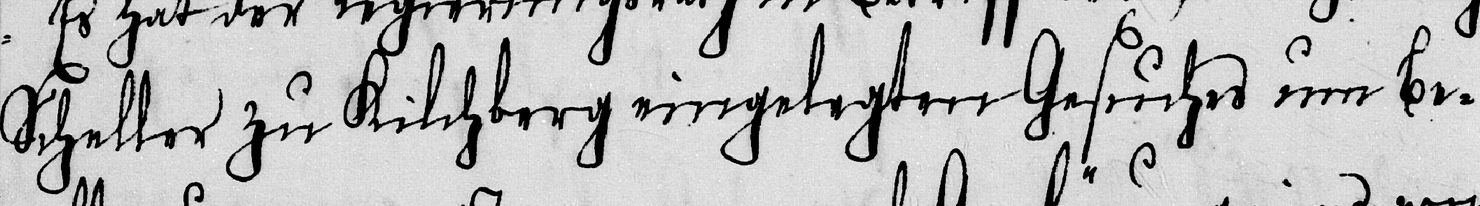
Scheller zu Kilchberg eingelegten Gesuches um Be¬
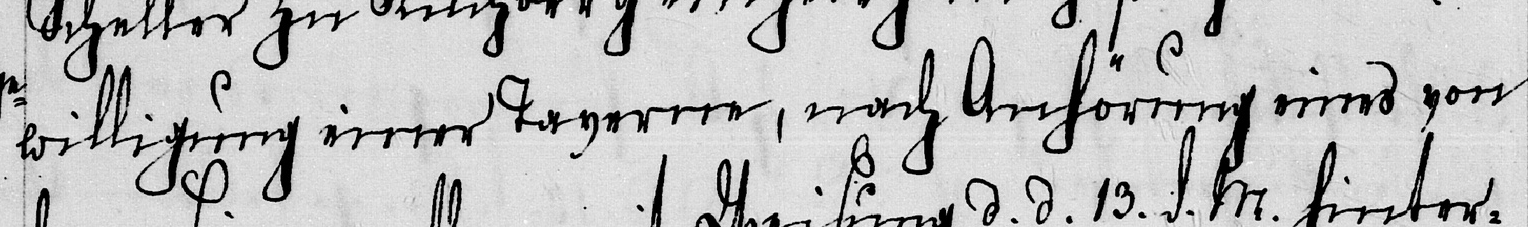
willigung einer Taverne, nach Anhörung eines von
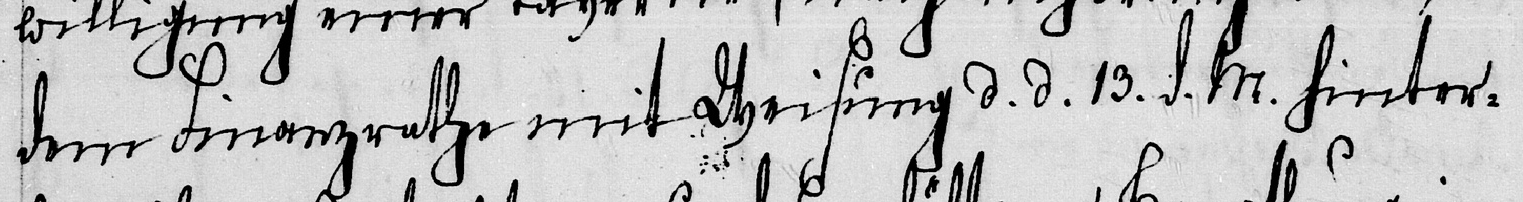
dem Finanzrathe mit Weisung d. d. 13. d. M. hinter¬
